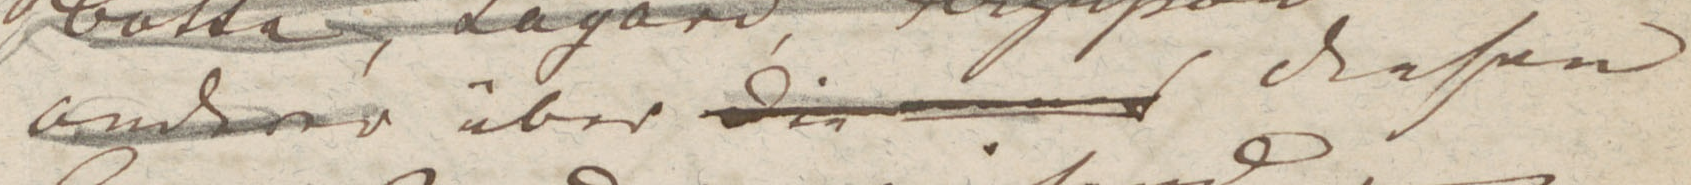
anderer über die diesen
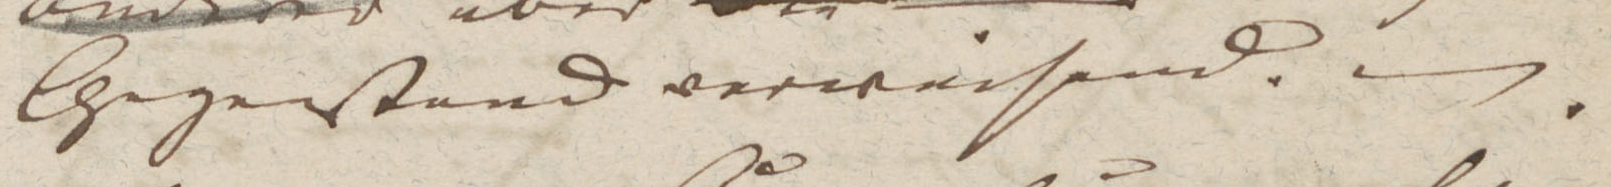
Gegenstand verweisend. – .
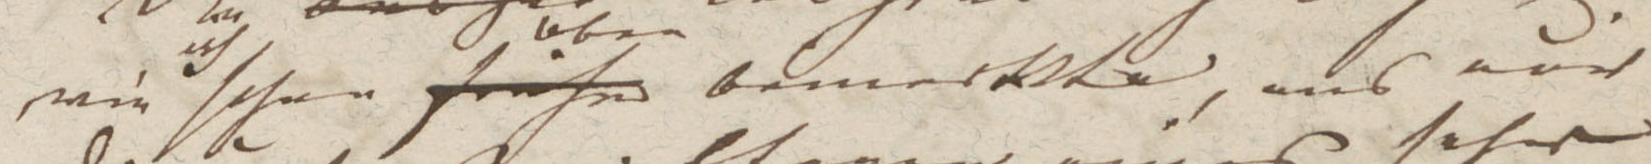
wie ich schon früher oben bemerkte, uns nur
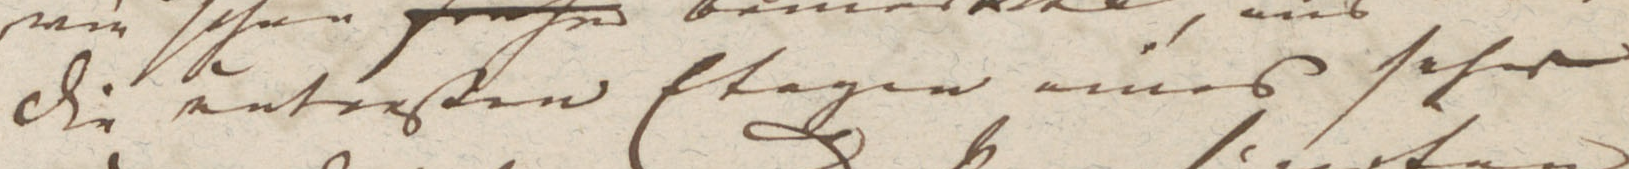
die untersten Etagen eines sehr
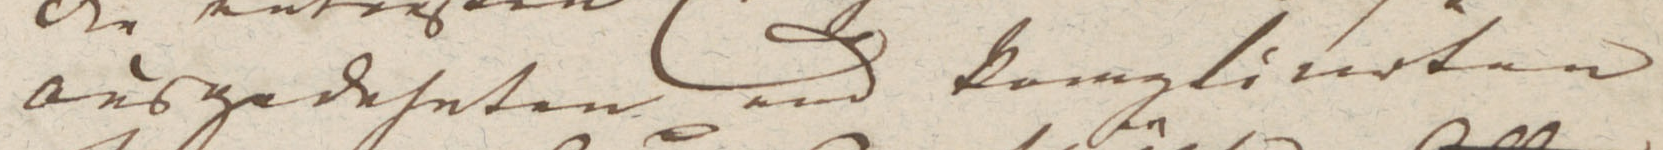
ausgedehnten und komplicirten
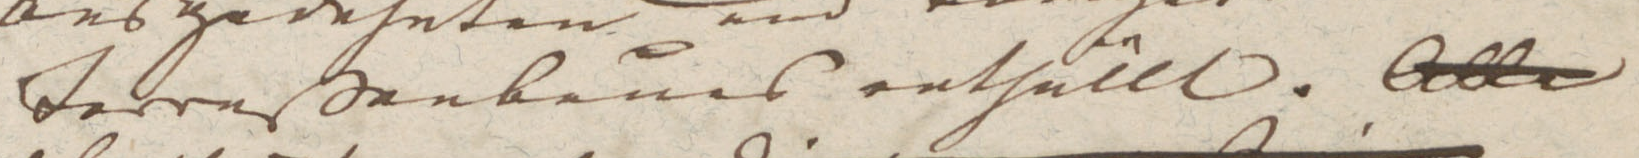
Terrassenbaues enthüllt. Alle
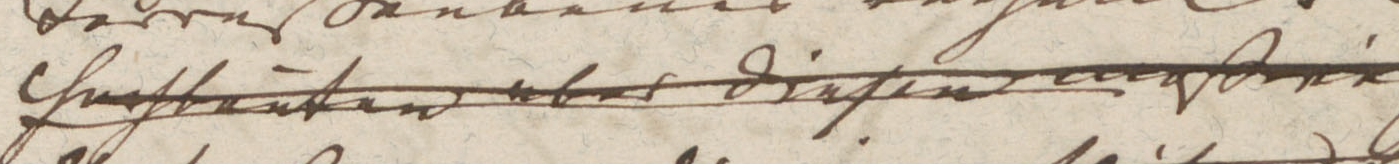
Hochbauten uber diesen massiven
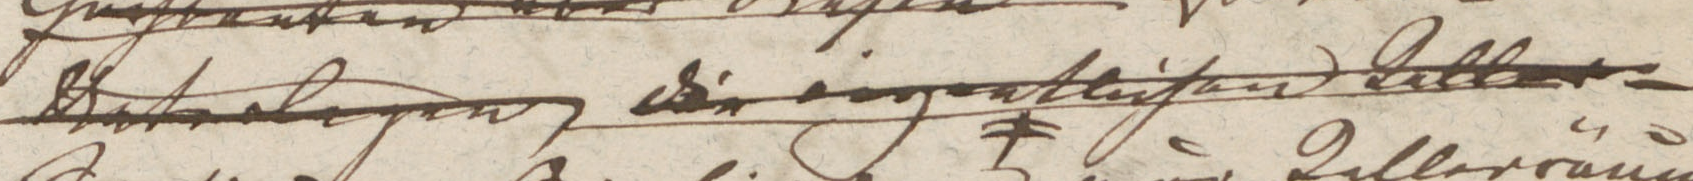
Unterlagen die eigentlichen Keller-
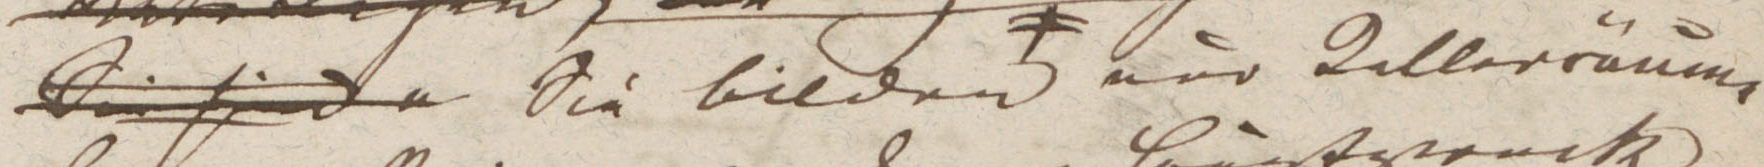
Sie sind Sie bilden % nur Kellerräume
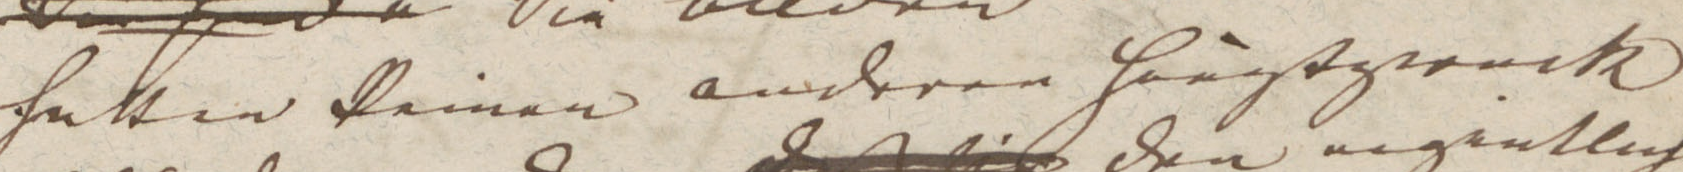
hatten keinen anderen Hauptzweck
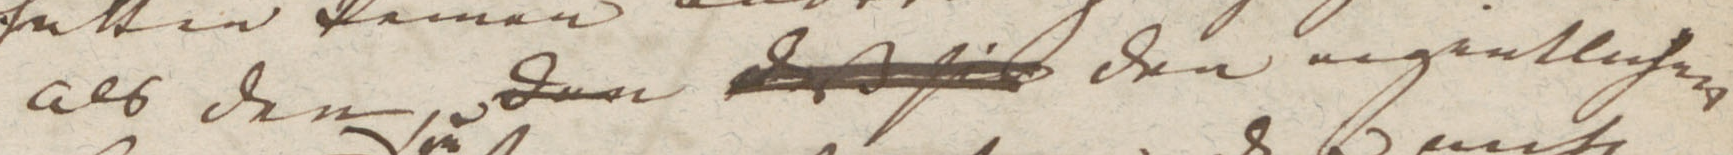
als den, den dass sie den eigentlichen
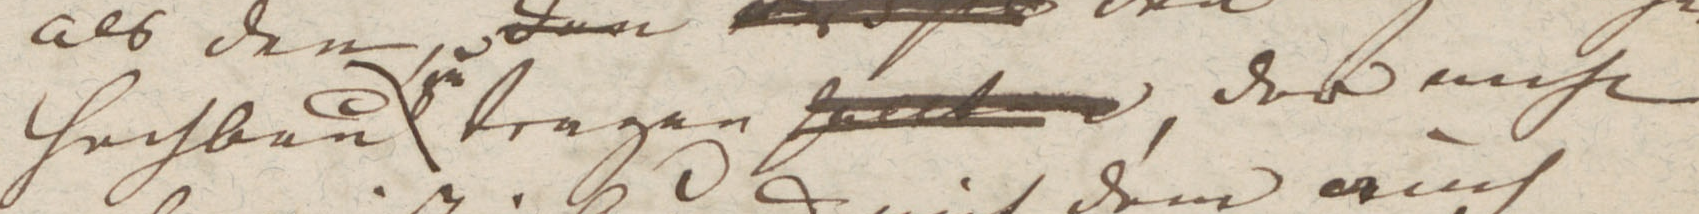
Hochbau zu tragen sollten, der nicht
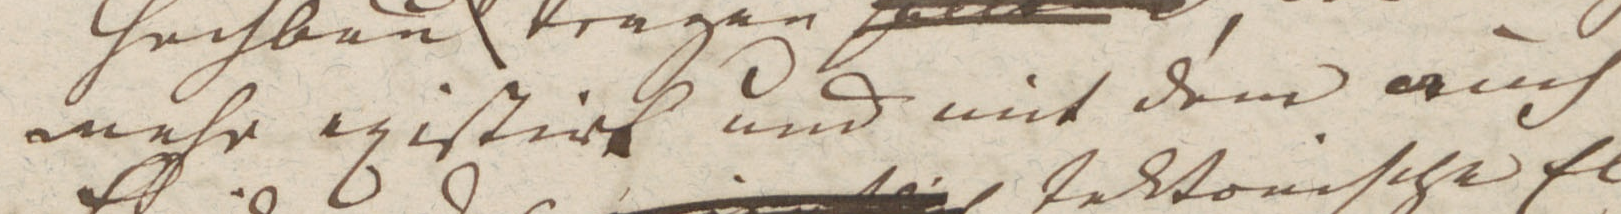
mehr existirt und mit dem auch
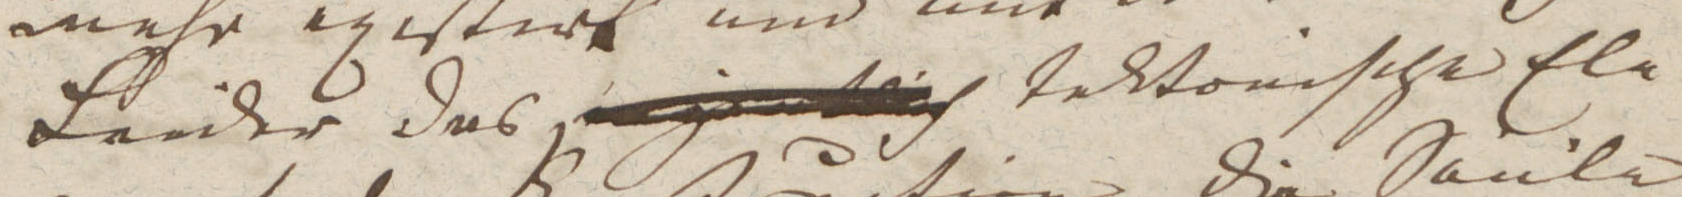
Leider das eigentlich tektonische Ele-
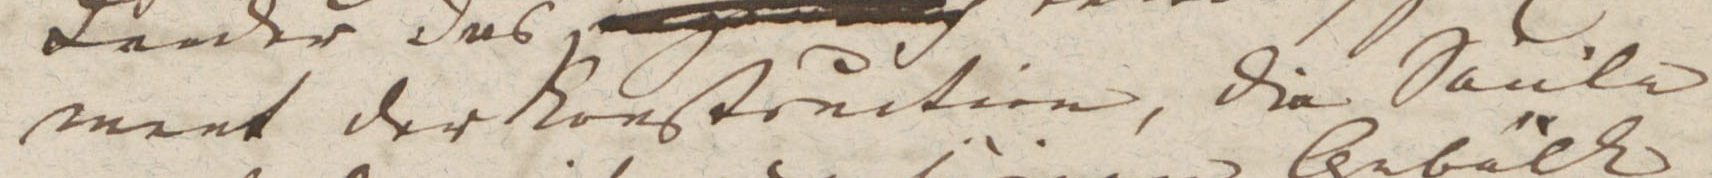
ment der Konstruction, die Säule
